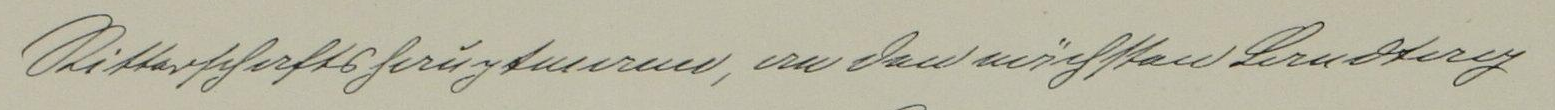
Ritterschaftshauptmann, an den nächsten Landtag
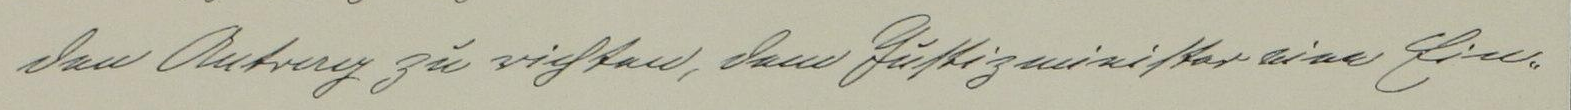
den Antrag zu richten, dem Justizminister eine Ein-
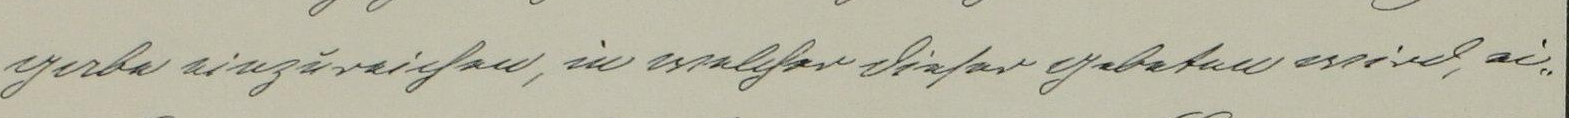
gabe einzureichen, in welcher dieser gebeten wird, ei-
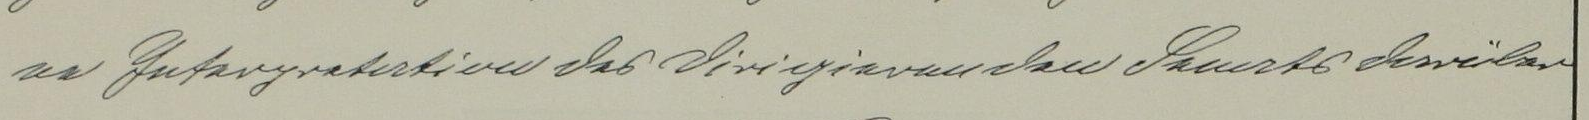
ne Interpretation des Dirigierenden Senats darüber
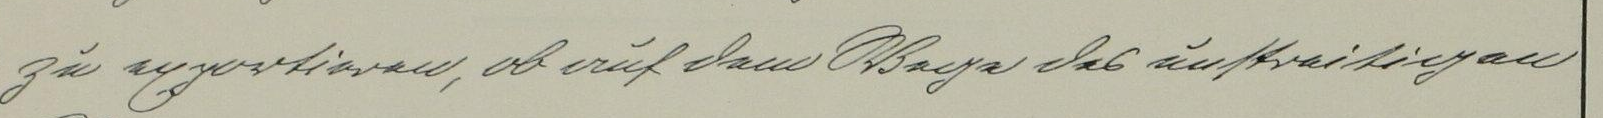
zu exportieren, ob auf dem Wege des unstreitigen
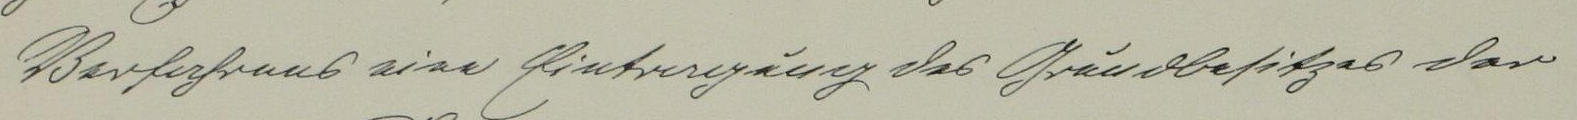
Verfahrens eine Eintragung des Grundbesitzes der
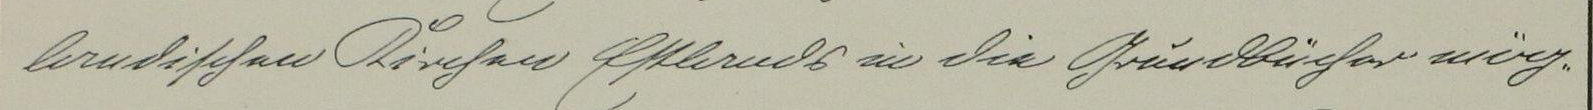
landischen Kirchen Estlands in die Grundbücher mög-
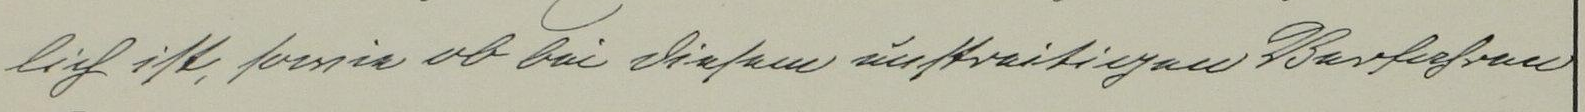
lich ist, sowie ob bei diesem unstreitigen Verfahren
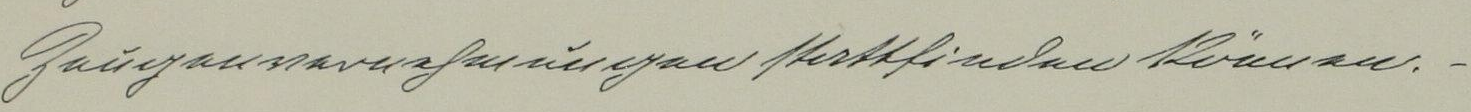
Zeugenvernehmungen stattfinden können.
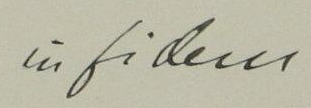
in fidem
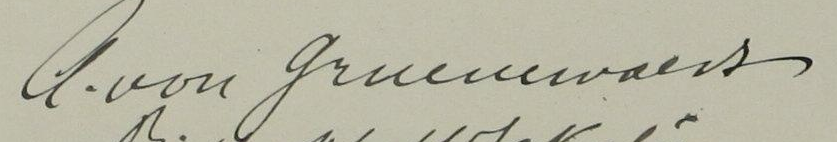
A. v. Gruenewaldt
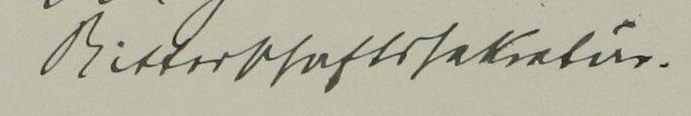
Ritterschaftssekretär
